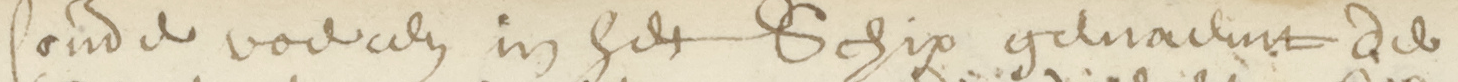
soude voeren in het Schip genaemt de
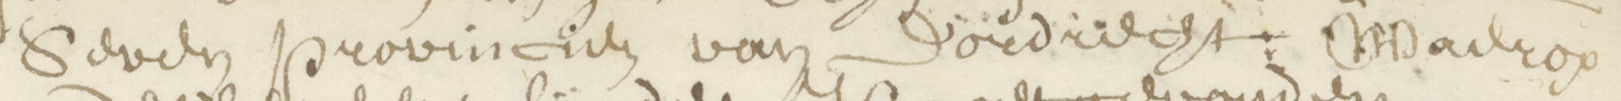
Seven Provincien van Dordrecht: Waerop
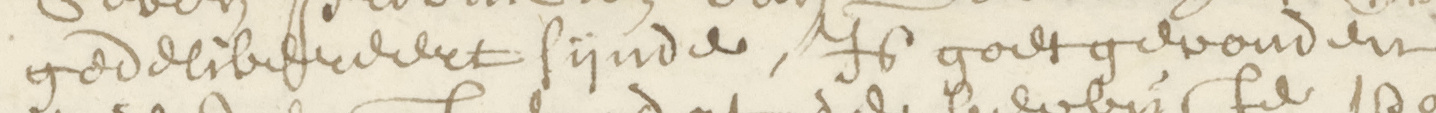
gedelibereert sijnde, is goetgevonden
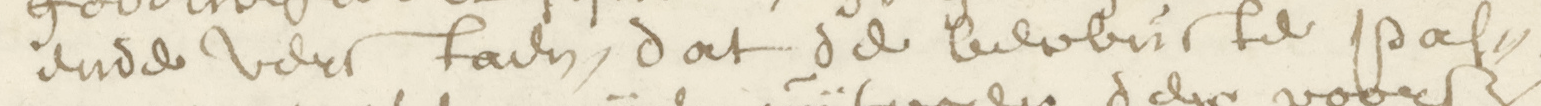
ende verstaen, dat de bewuste pas„
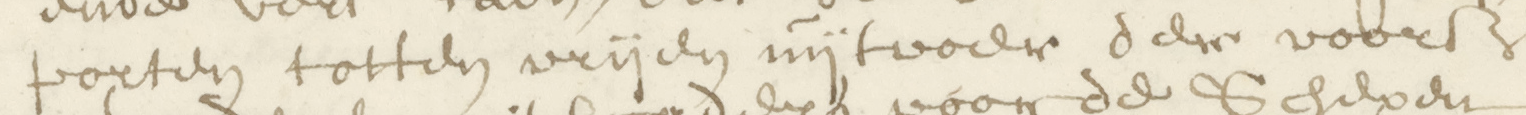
porten totten vrijen uijtvoer der voors
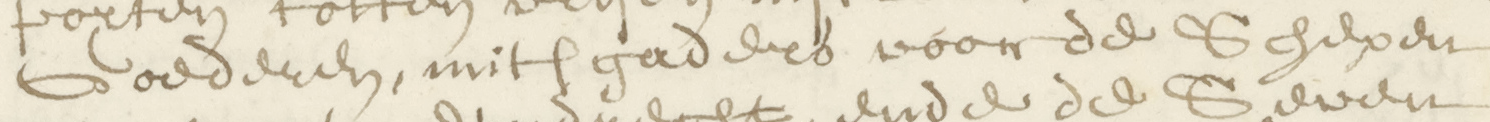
Goederen, mitsgaders voor de schepen
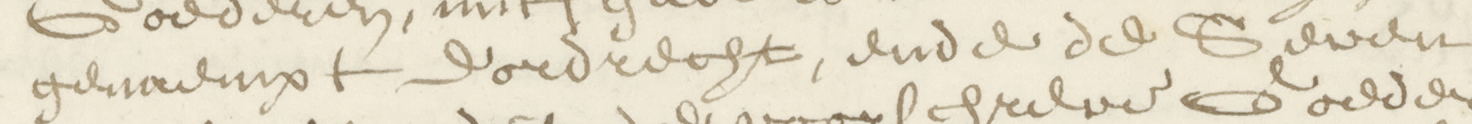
genaempt Dordrecht, ende de Seven
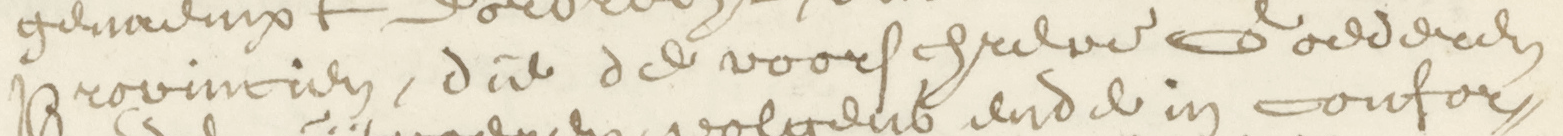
Provincien, die de voorschreve Goederen
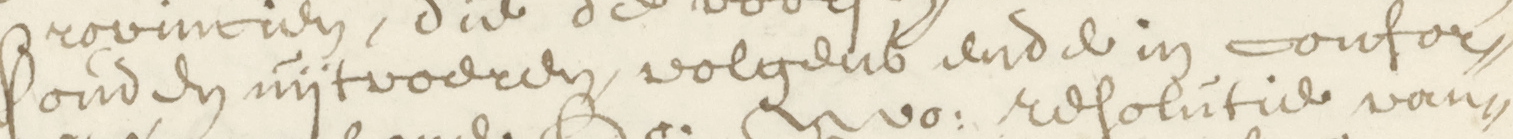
souden uijtvoeren, volgens ende in confor,,
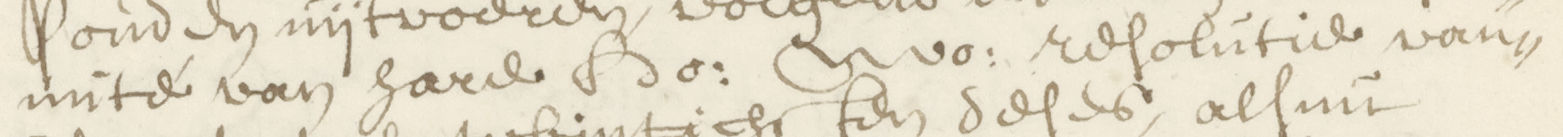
mité van hare Ho:Mo: resolutie van„,
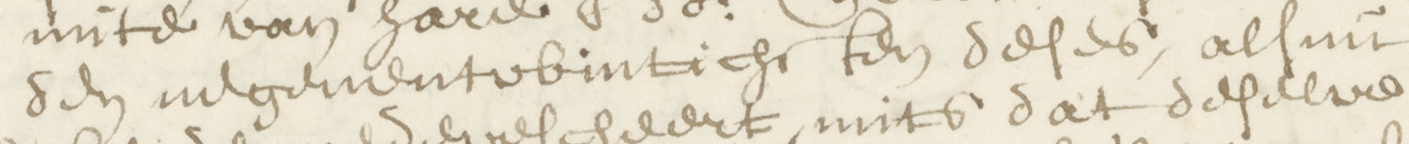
den negenentwintichsten deses, alsnu
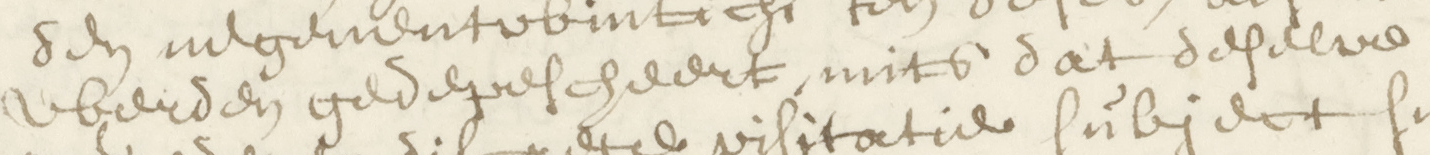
werden gedepescheert, mits dat deselve
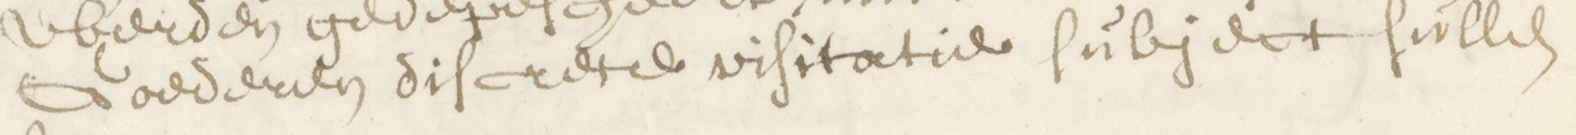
Goederen discrete visitatie subject sullen
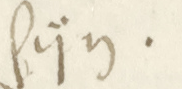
sijn.
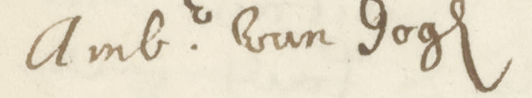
Ambr. van Gogh
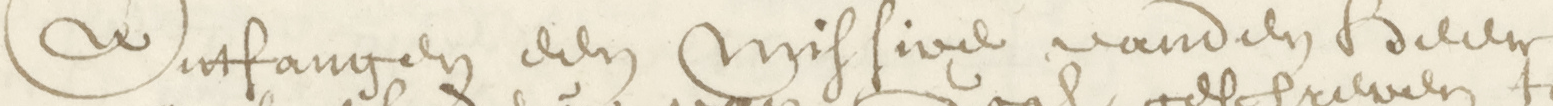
Ontfangen een missive vanden Heer
